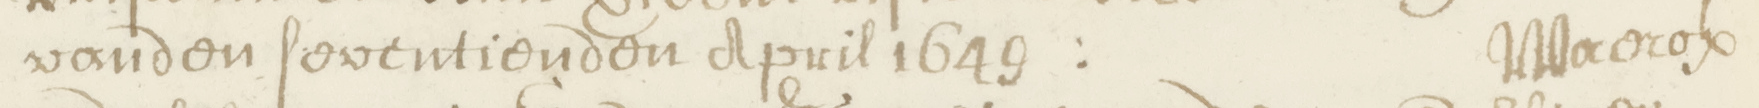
vanden seventienden April 1649: Waerop
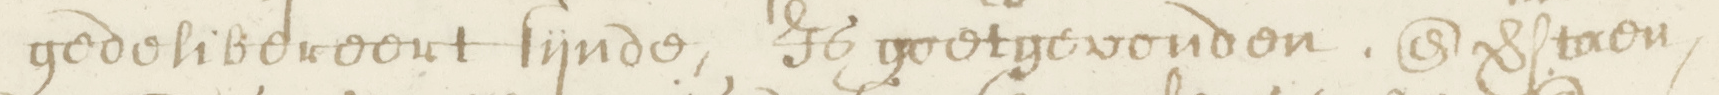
gedelibereert sijnde, Is goetgevonden, & vstaen,
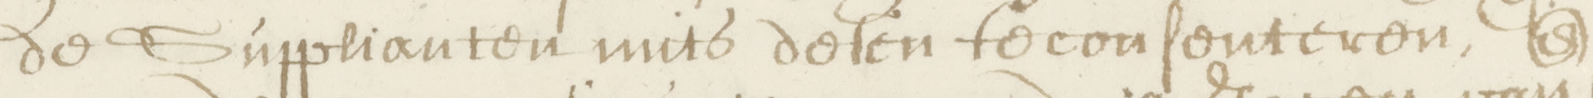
de Supplianten mits desen te consenteren, &
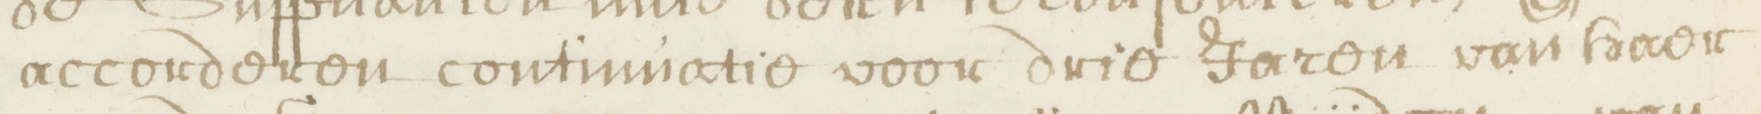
accorderen continuatie voor drie Jaren van haer
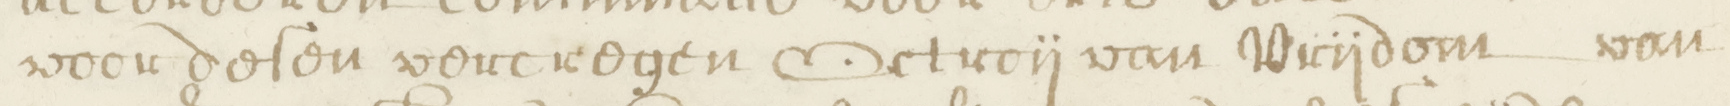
voor desen vercregen Octroij van Vrijdom van
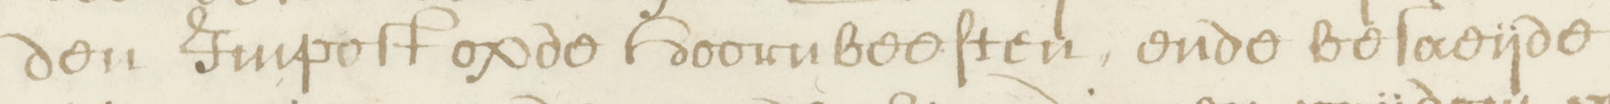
den Impost op de Hoornbeesten, ende besaeijde
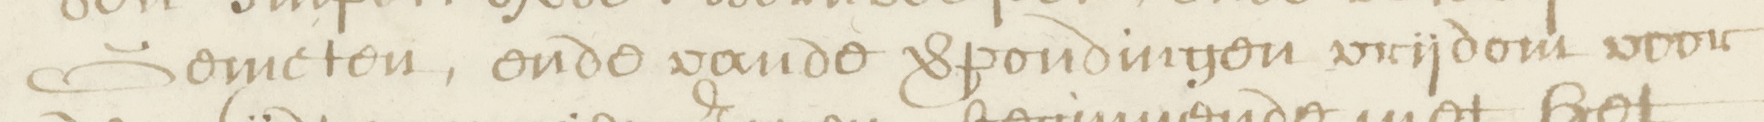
Gemeten, ende vande vpondingen vrijdom voor
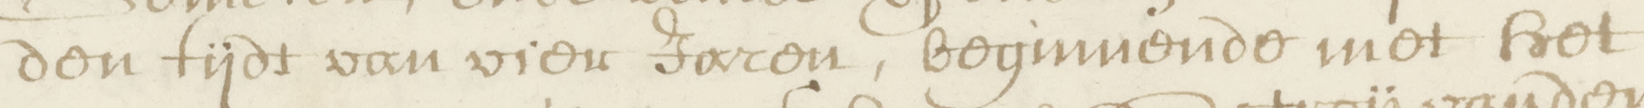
den tijdt van vier jaren, beginnende met het
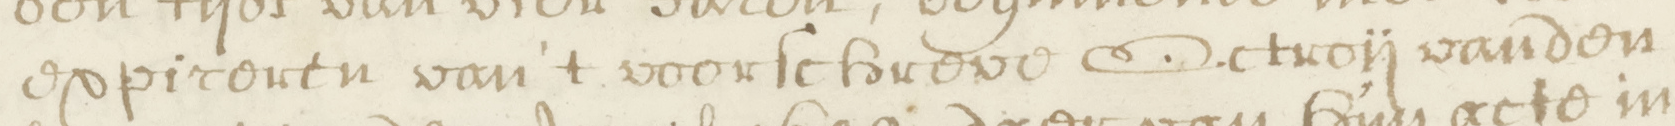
expireren van 't voorschreve Octroij vanden
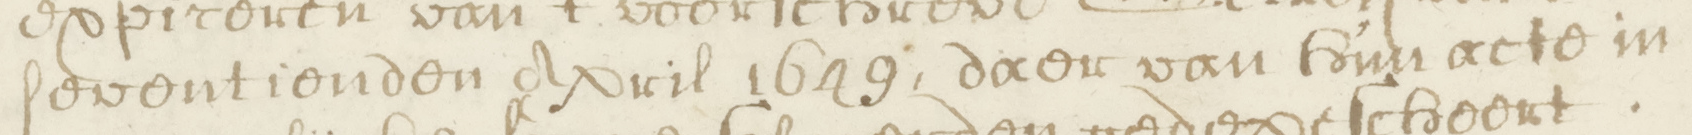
seventienden April 1649, daer van hun acte in
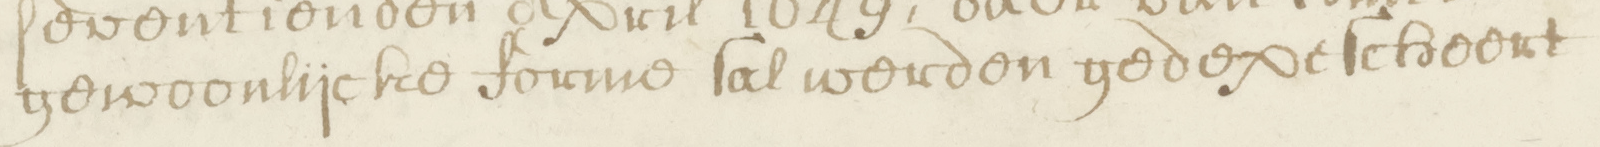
gewoonlijcke forme sal werden gedepescheert
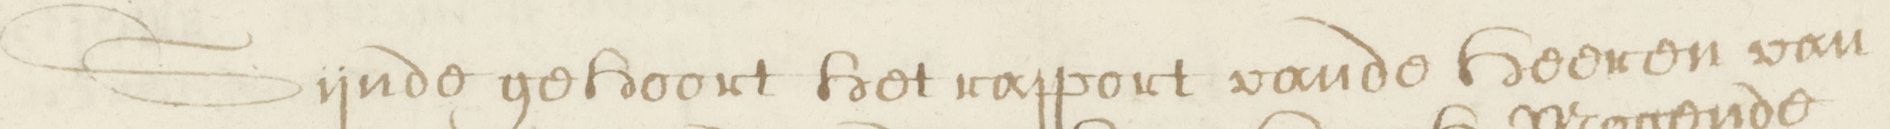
Sijnde gehoort het rapport vande heeren van
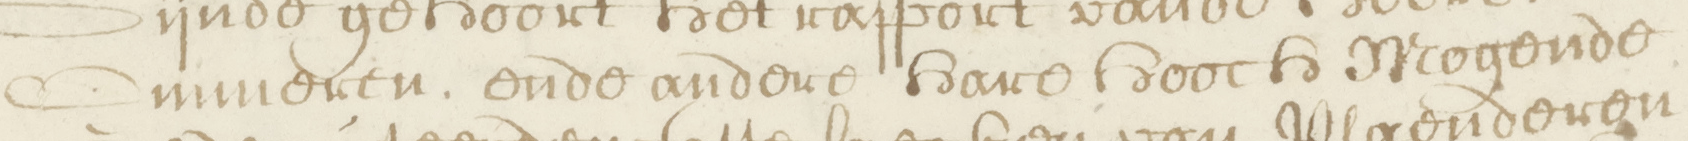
Ommeren, ende andere hare hooch mogende
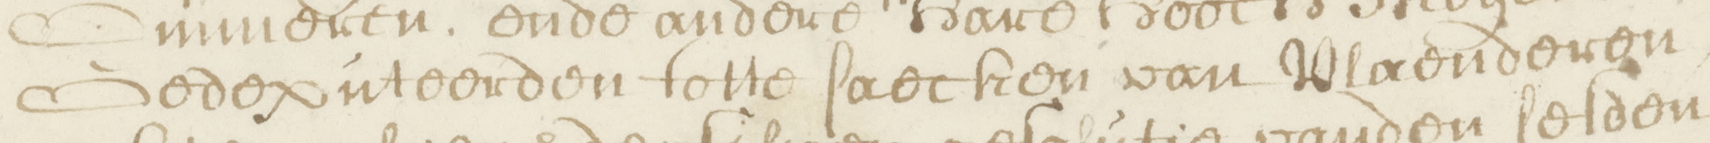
Gedeputeerden totte saecken van Vlaenderen
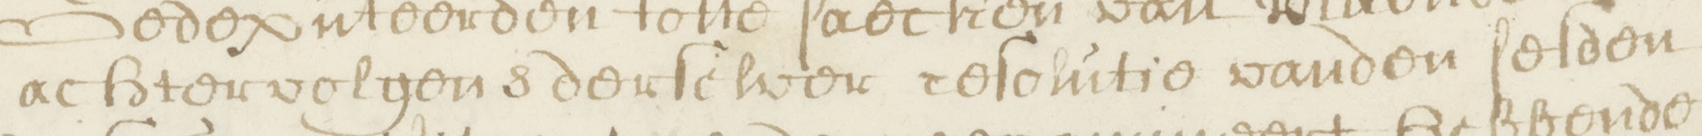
achtervolgens derselver resolutie vanden sesden
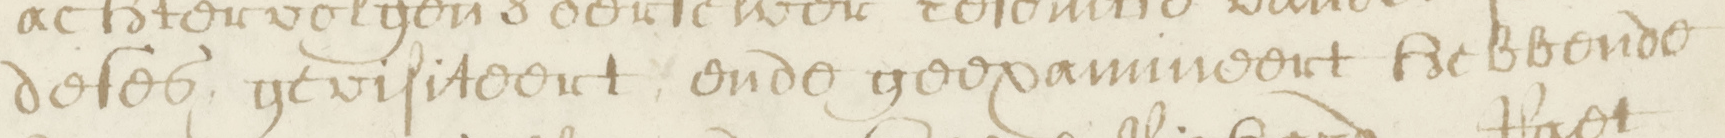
deses, gevisiteert, ende geexamineert hebbende
